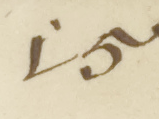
15
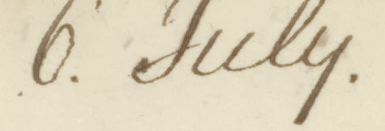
6. July.
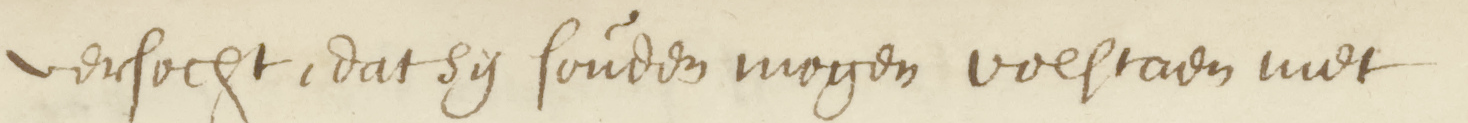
versocht, dat sij souden mogen volstaen met
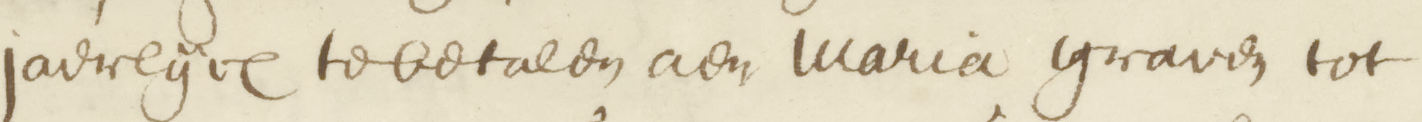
jaerlijcx te betalen aen maria graven tot
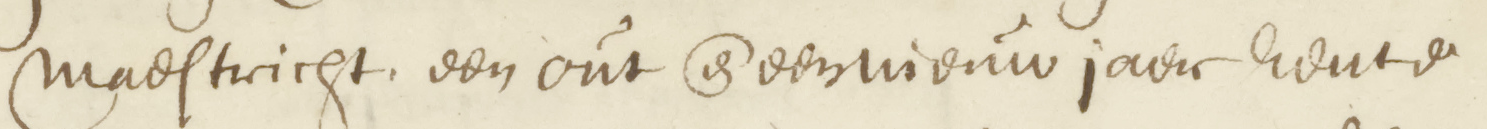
maestricht een out & een nieuw jaer rente
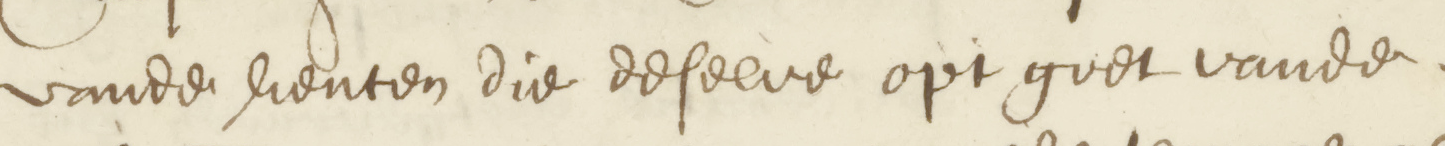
vande renten die deselve opt gelt vande
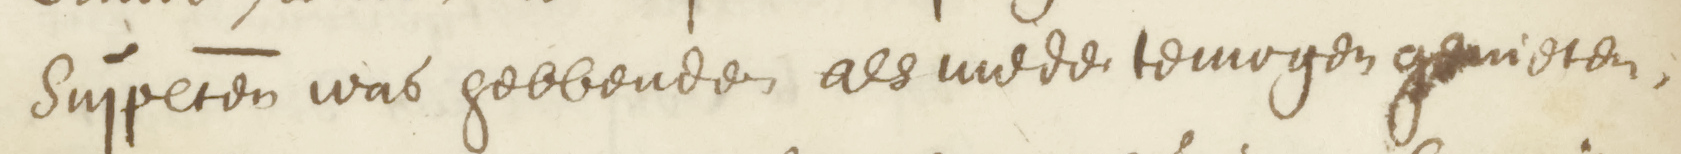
Supplten was hebbende als mede te mogen genieten,
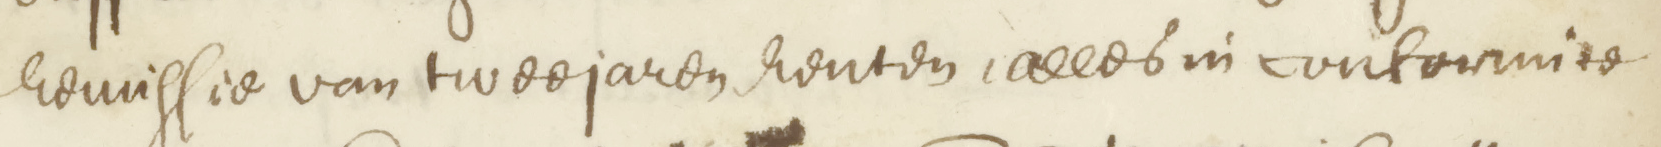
remissie van twee jaren renten alles in conformite
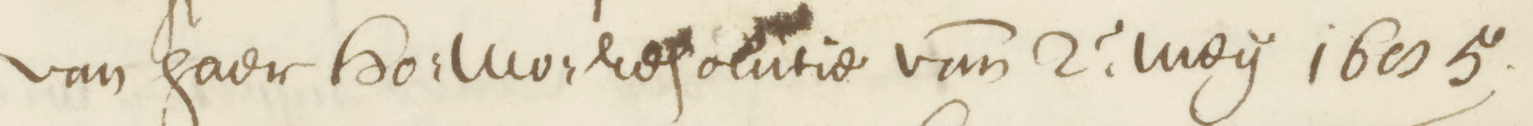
van haer ho:mo: resolutie van 2e meij 1685
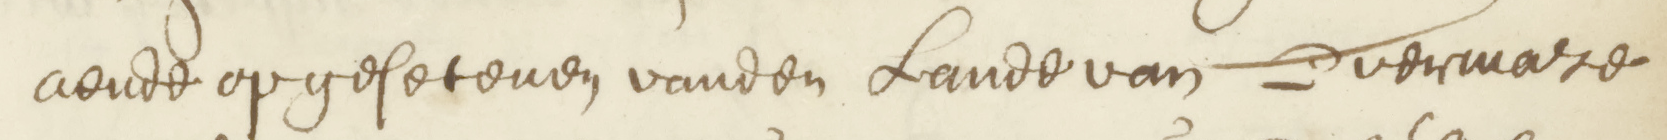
aende opgesetenen vanden Lande van Overmaze
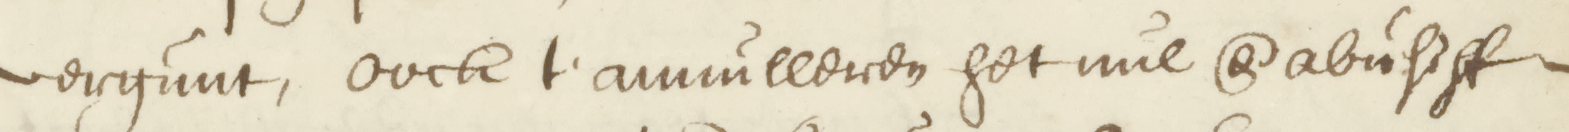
vergunt, oock t‛ annulleren het nul & abusiff
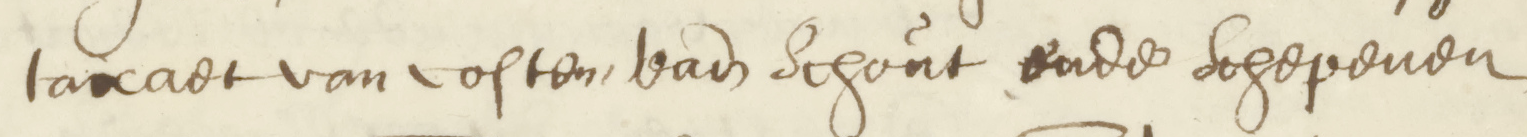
taxaet van costen, van Schout ende Schepenen
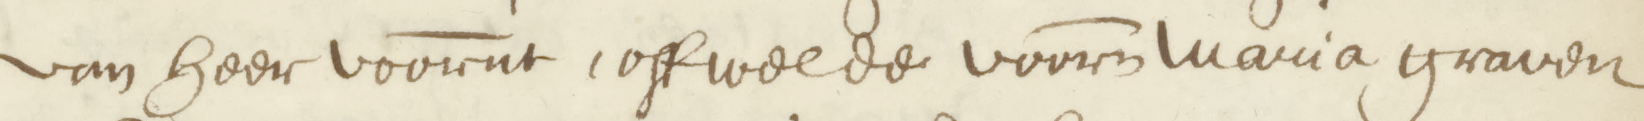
van heer voorn., oftwel de voorn. Maria graven
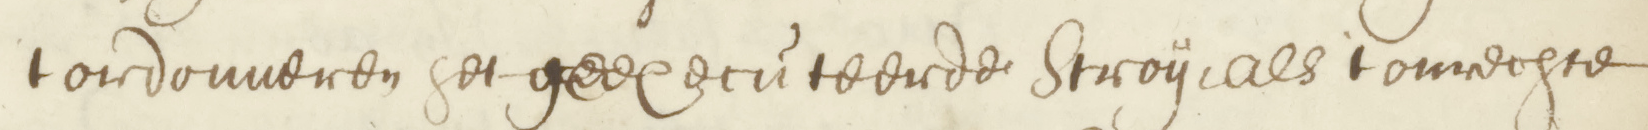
t ordonneren het geexecuteerde Stroij als t onrechte
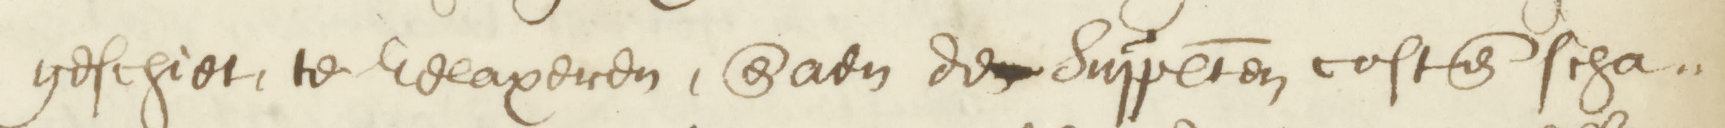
geschiet te relaxeren, & aen den Supplten costen scha„
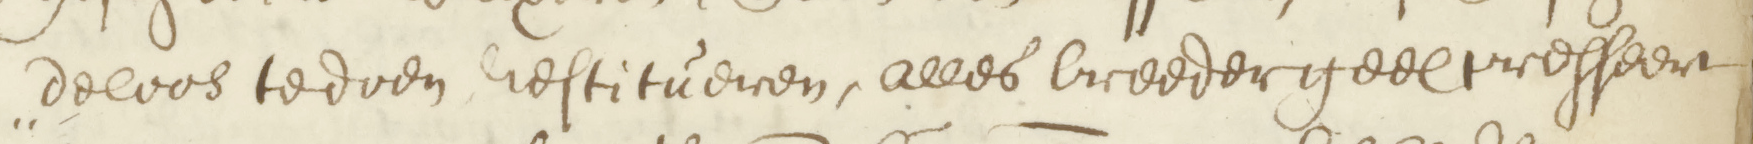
deloos te doen restitueren, alles breeder geexpresseert
